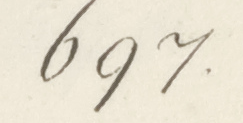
697.
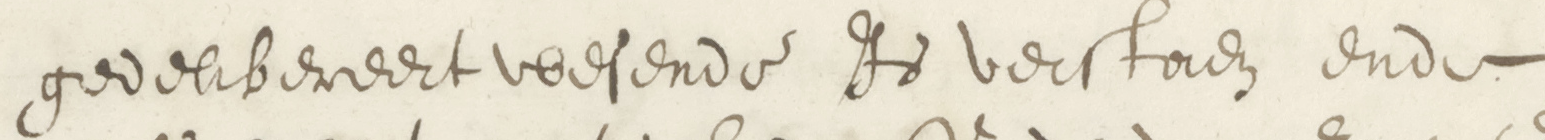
gedelibereert wesende Is verstaen ende
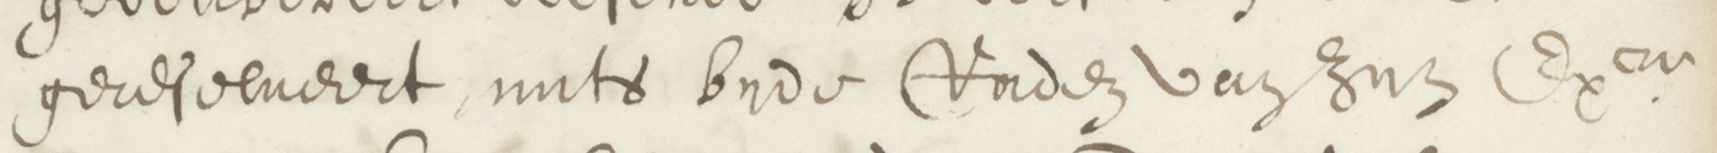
geresolueert, mits byde Raden van Zyn Excie.
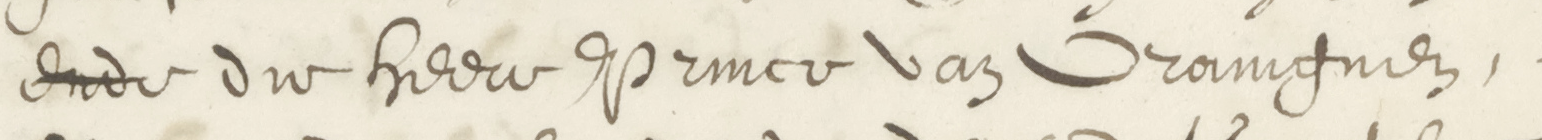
ende die heere Prince van Oraingnen, -
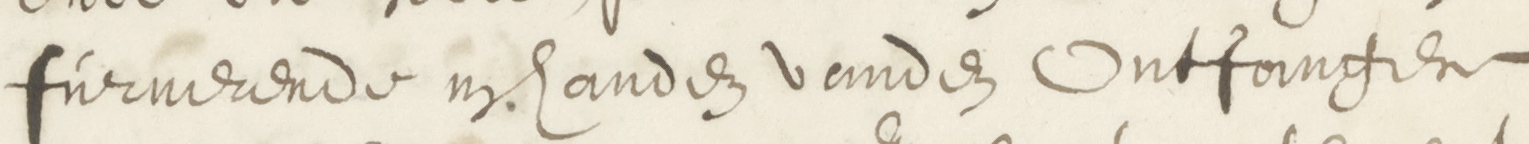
furnerende in handen vanden Ontfanger
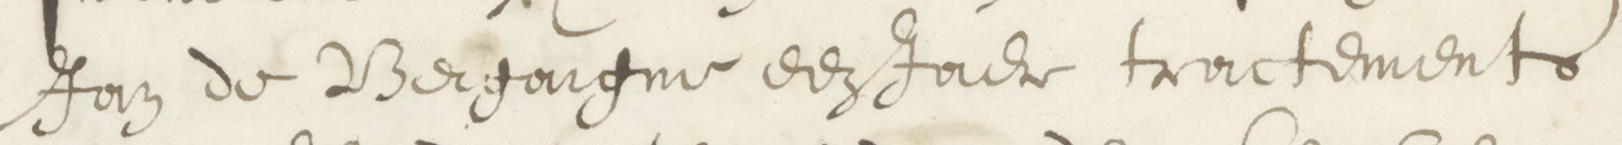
Jan de Bergaigne een Jaer tractements
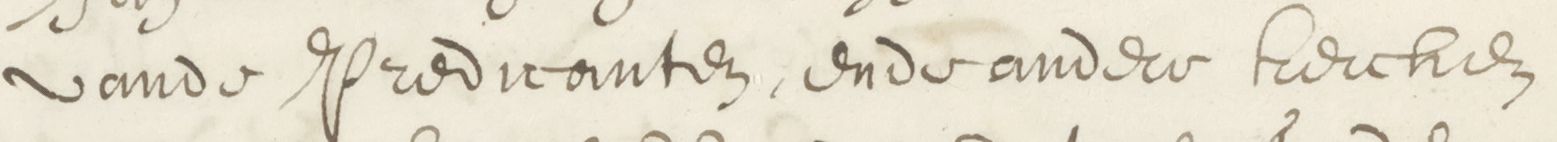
vande Predicanten, ende andere kercken
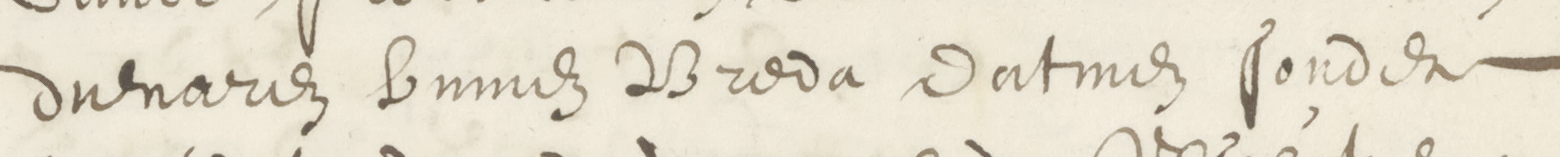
dienaren binnen Breda, datmen sonder
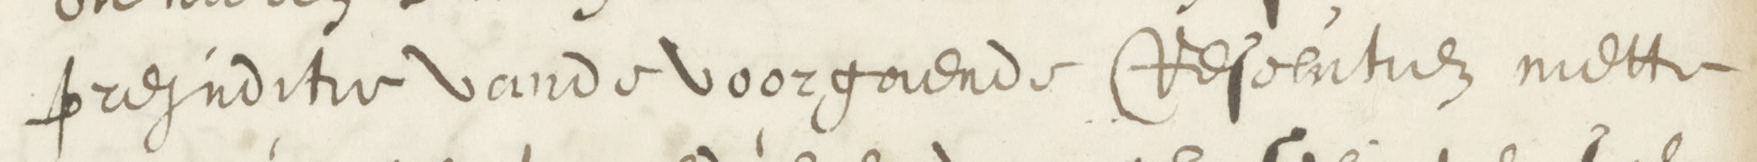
prejuditie vande voorgaende Resolutien mette
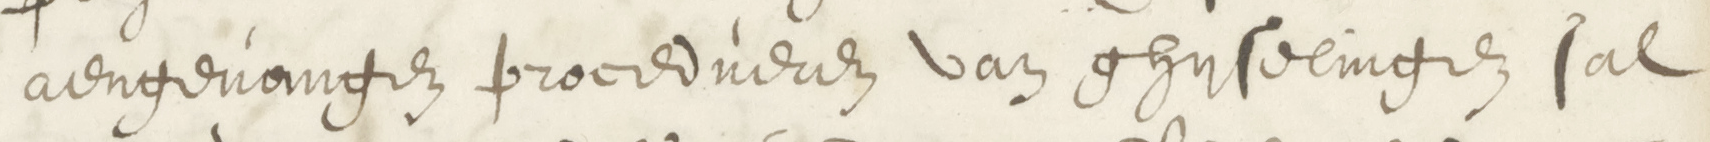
aengeuangen procedueren van ghyselingen sal
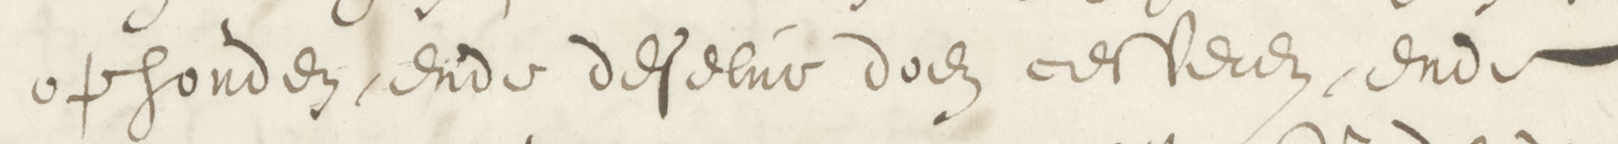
ophouden, ende deselue doen cesseren, ende
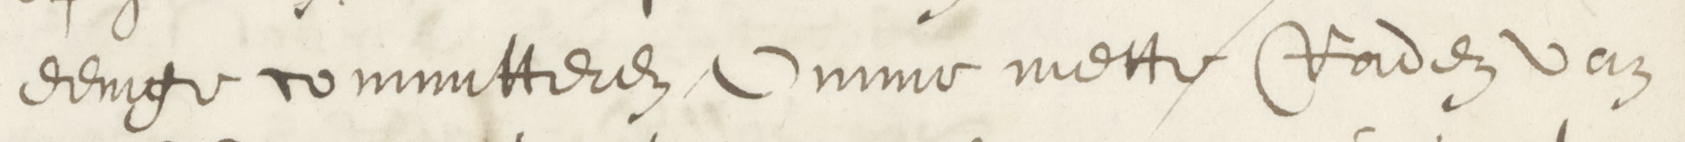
eenige committeren, Omme mette Raden van
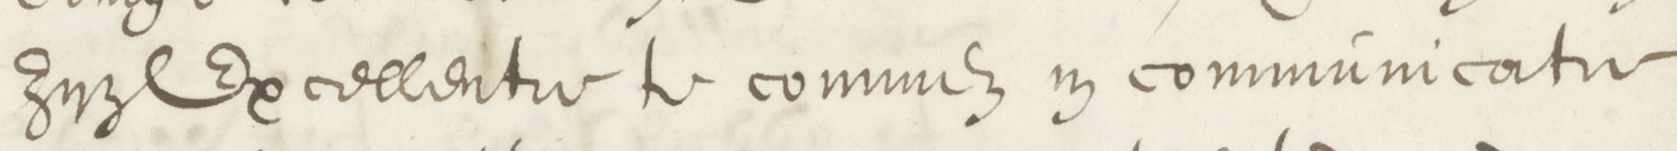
Zyn Excellentie te commen in communicatie
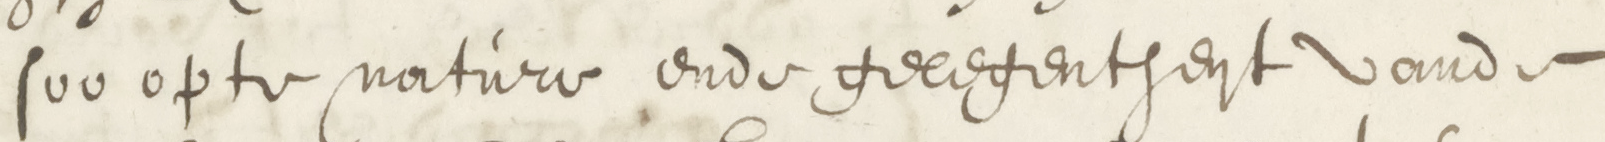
soo opte nature ende gelegentheyt vande
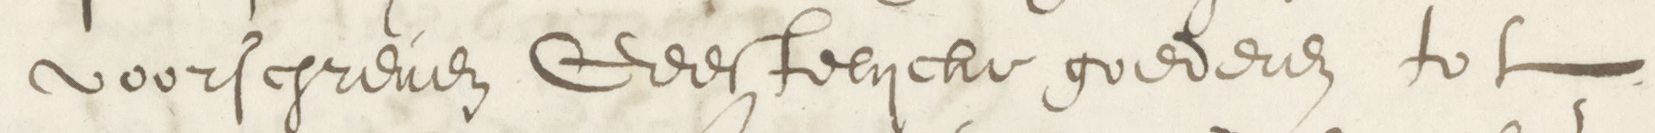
voorschreuen Geestelycke goederen tot
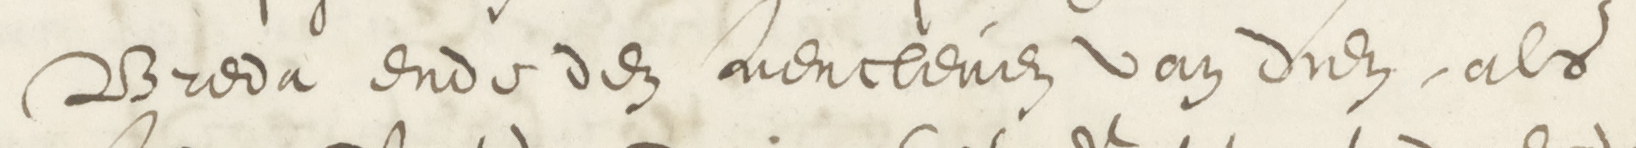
Breda ende den Aencleuen van dien, als
